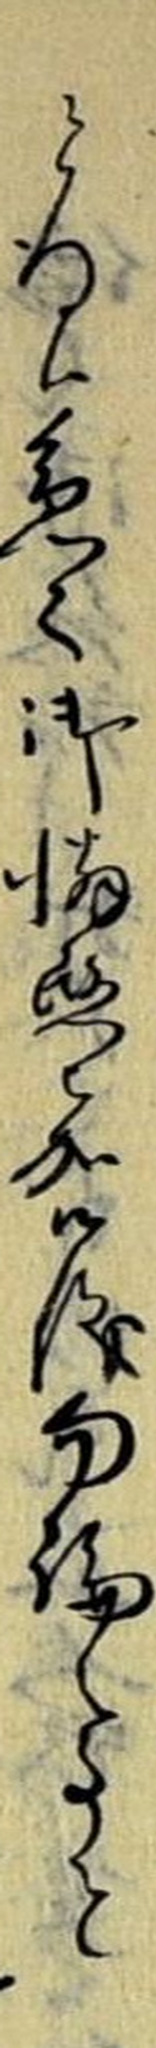に候得は悉く御憐愍被加御儀勿論之事に候
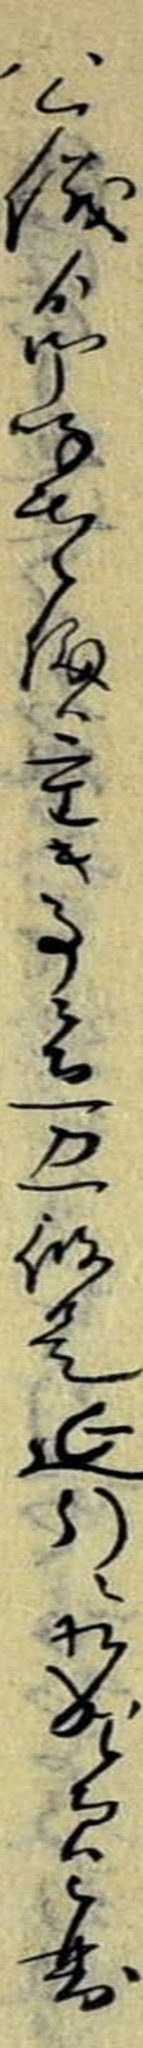公儀ゟ御呼出之儀は重キ事に而万一彼是延引に相成候而は被苦？
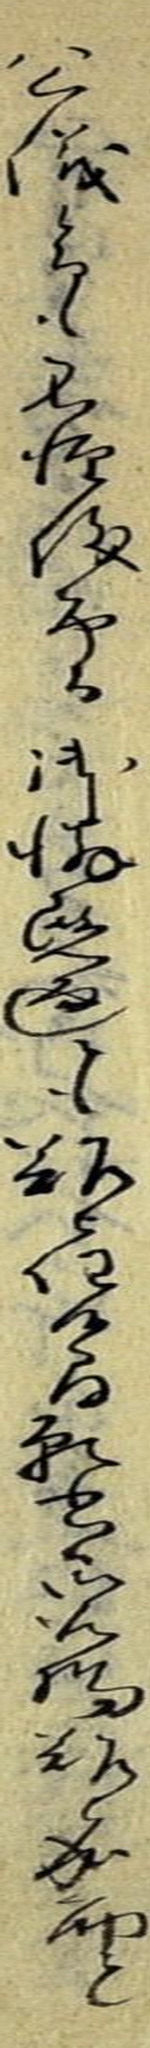公儀に而も不軽儀却而御憐愍通にも難被任候間願書は御取揚難被成筋に候
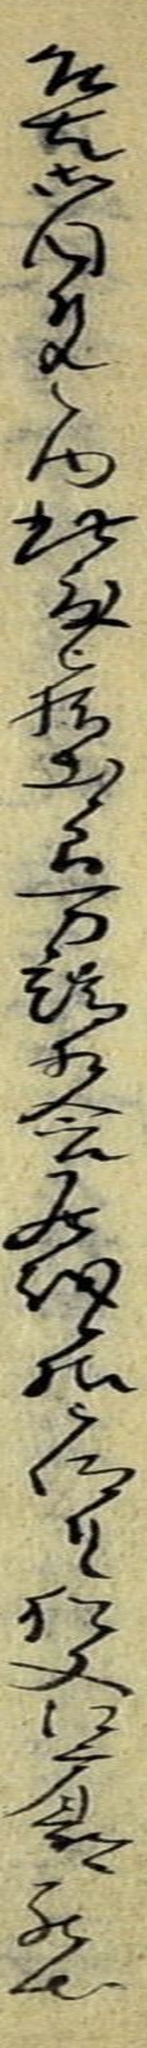乍去御目付共之内此度被指出候間万端相含罷越候様被仰付候猶又江戸表へ罷出
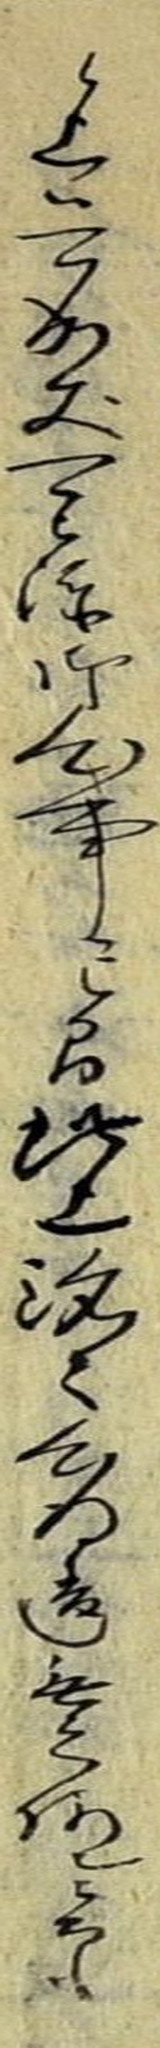候迄は可成丈可被添御心事に候間此上銘々心得違無之何レに而も
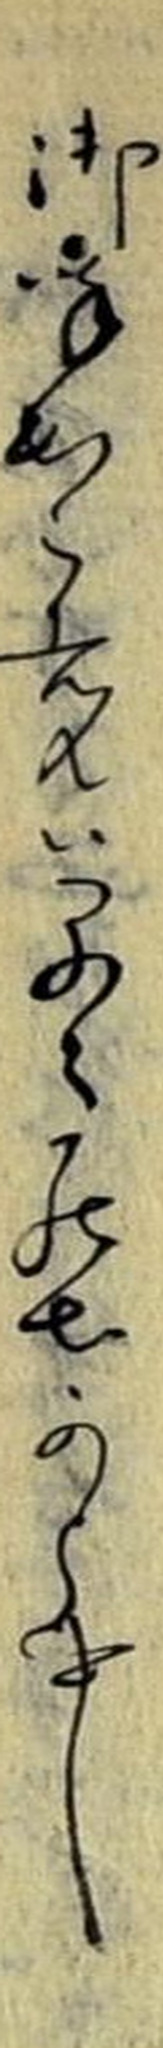御呼出之者共は早々罷出可申事
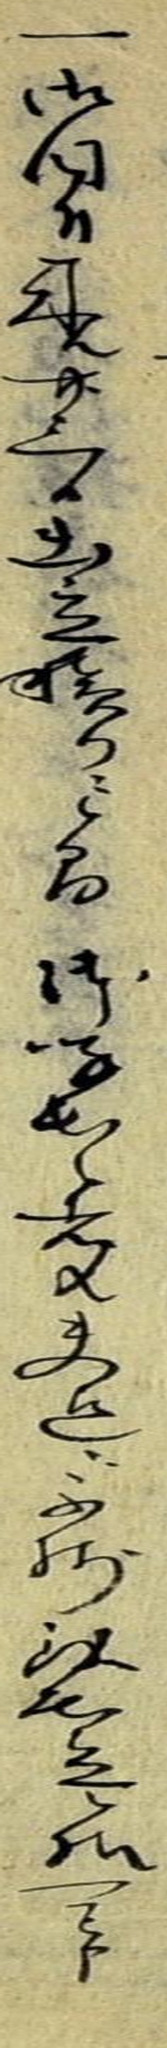一御目付来ル廿三日出立積りに候間御呼出之者共夫迄に不残致出立候様可被申
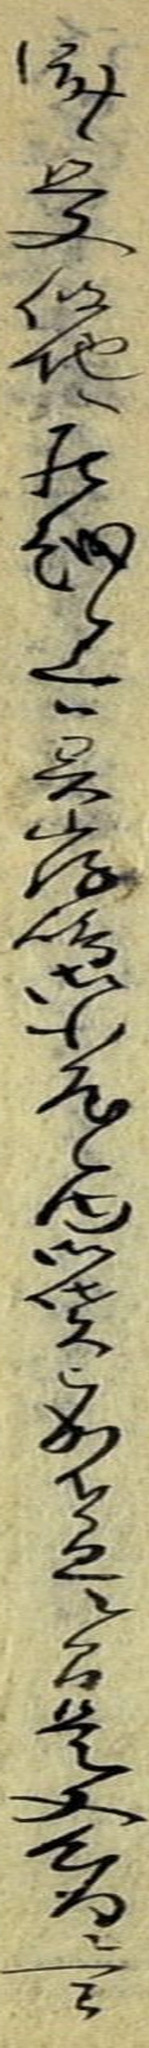渡候且又彼地へ罷越候上は霊岸嶋御小屋之内御貸被成下置候間是又心得に可被
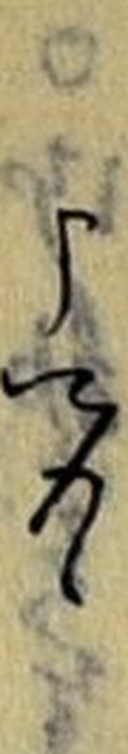申聞候
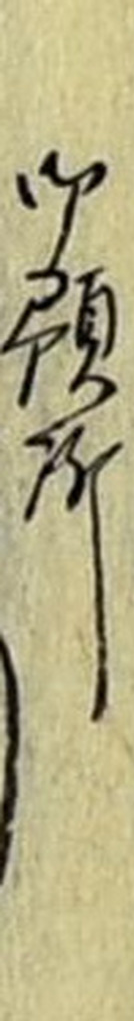御預所
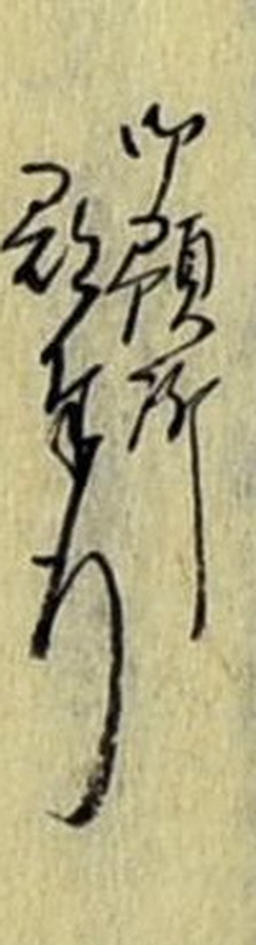郡奉行
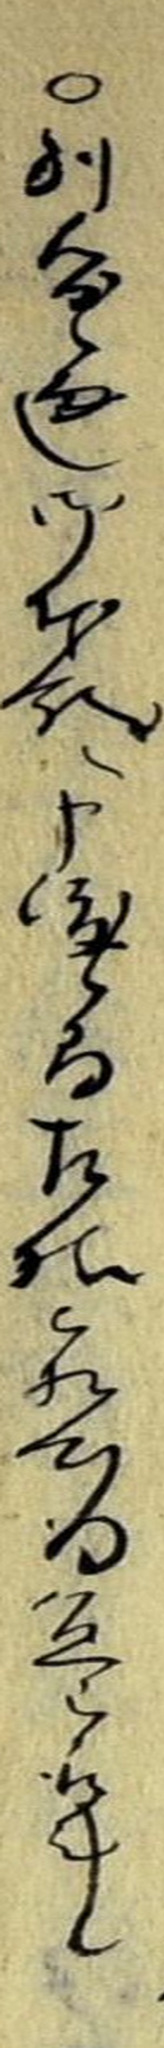○別紙之通御本領へ申渡候間左様被相心得宜可被取斗候

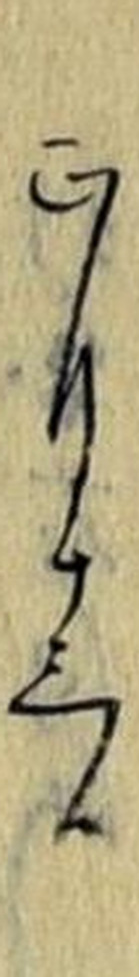正月十三日
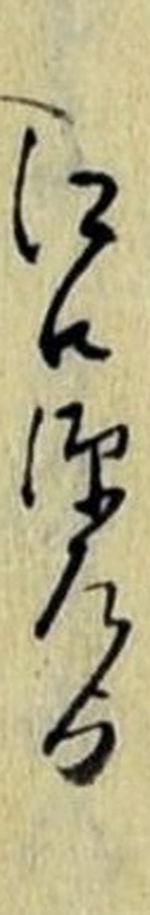江口源左衛門
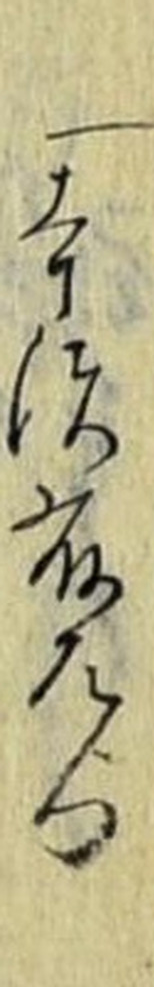寺沢藤左衛門
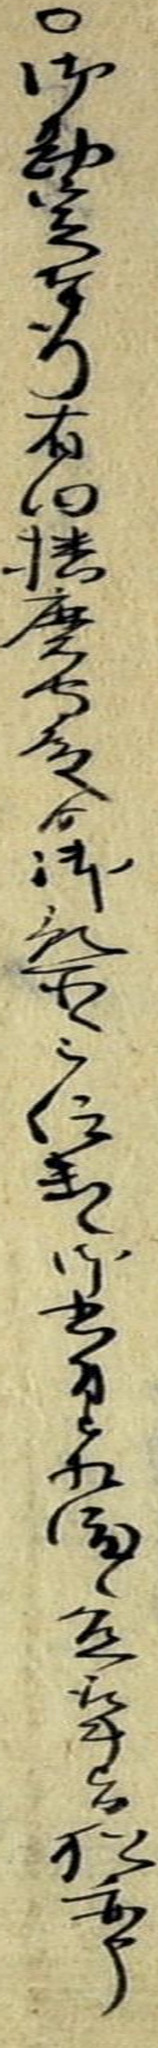○御勘定奉行有田播磨守殿ゟ御預所へ被仰出候御書付被相渡候宜取斗旨猶亦申
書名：命令之部 四
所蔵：福井県文書館 Fukui Prefectural Archives
